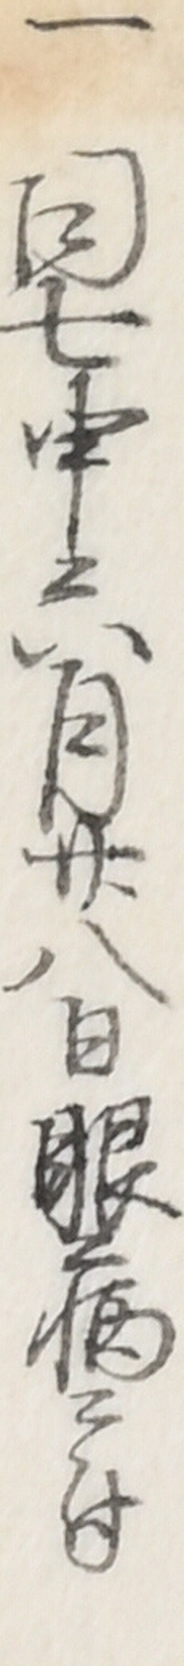一同七申六月廿八日眼病ニ付
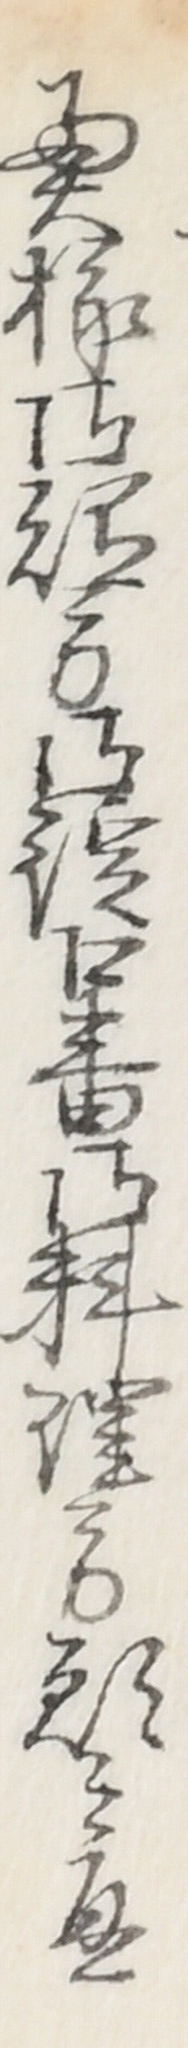奥様御賄方御錠口番御料理方願之通
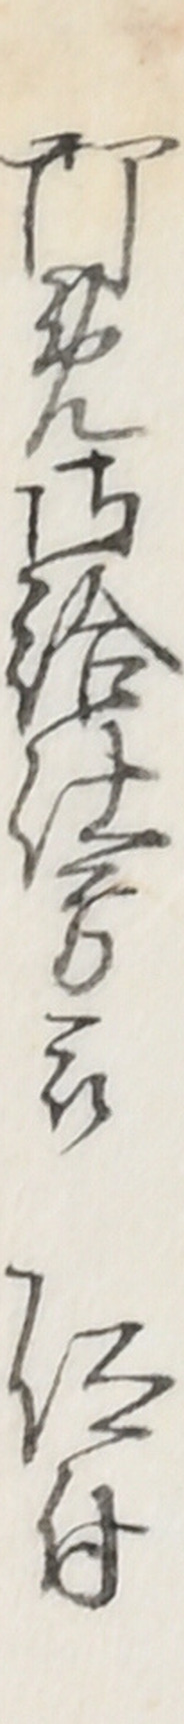御免御給仕方被仰付
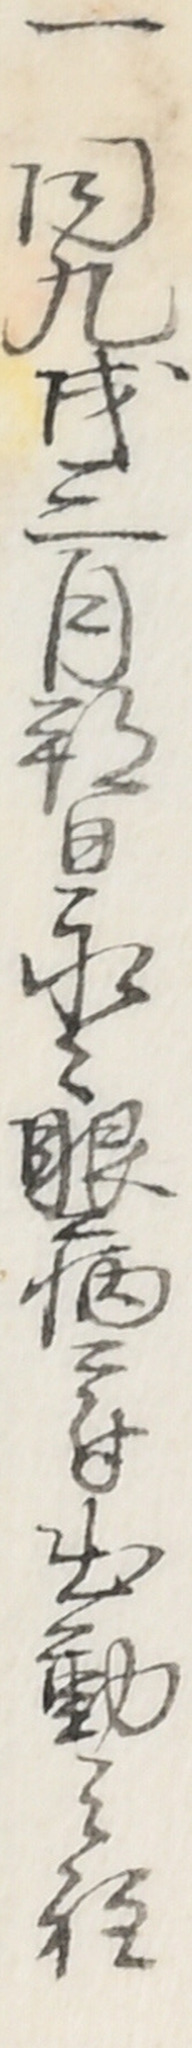一同九戌三月朔日永々眼病ニ付出勤之程
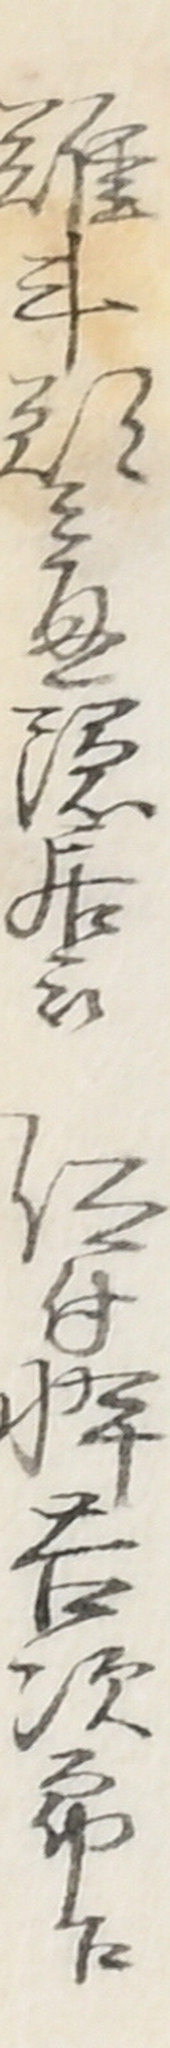難計願之通隠居被仰付忰吉次郎江
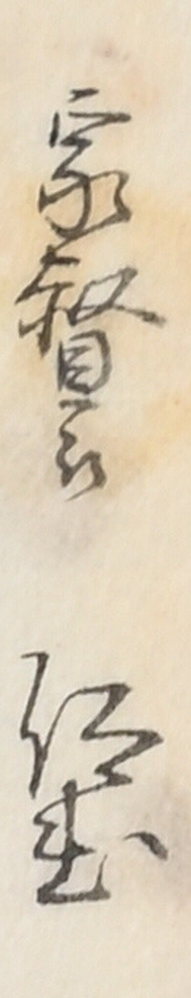家督被仰出
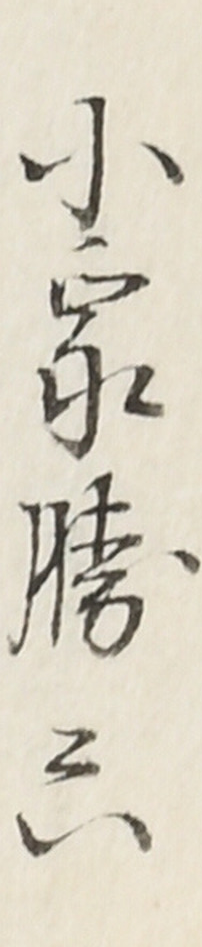小泉勝六
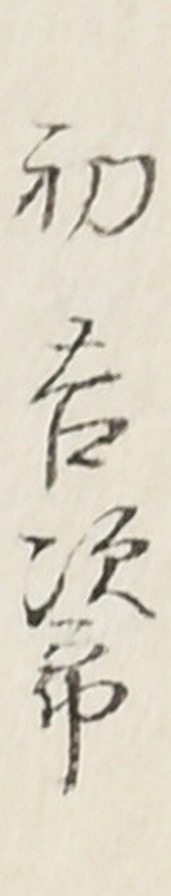初吉次郎
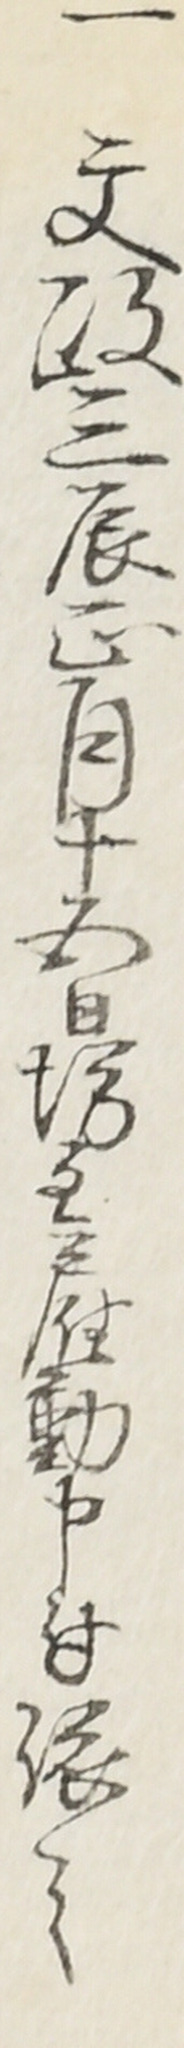一文政三辰正月十五日坊主雇勤申付依之
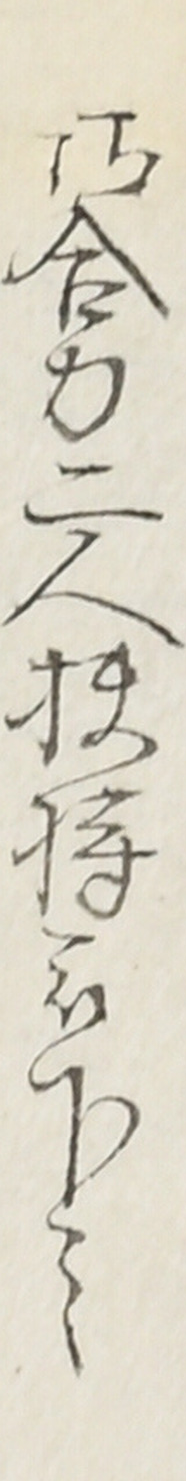御合力二人扶持被下之
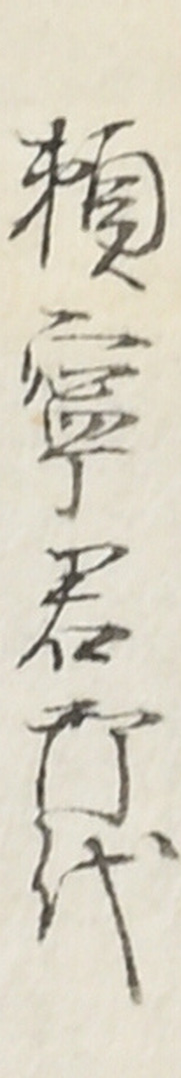頼寧君御代
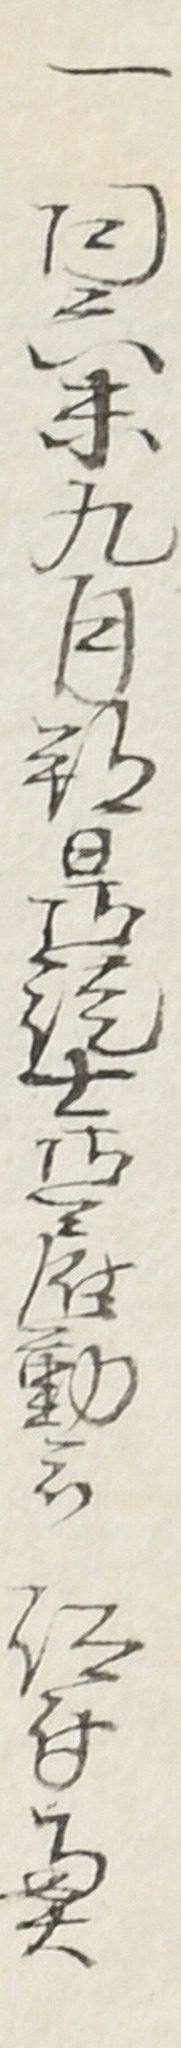一同六未九月朔日御徒士御雇勤被仰付奥
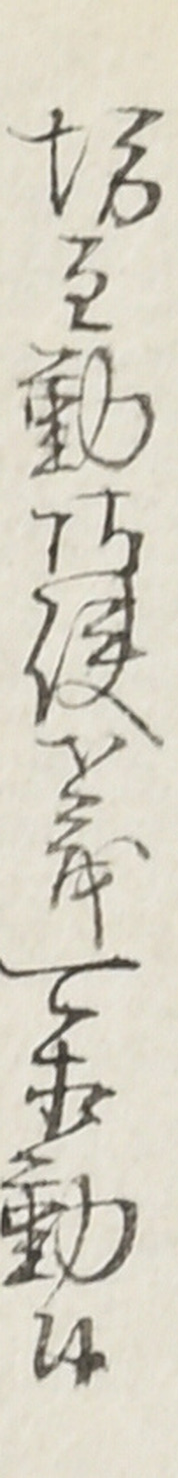坊主勤御使を茂可相勤候
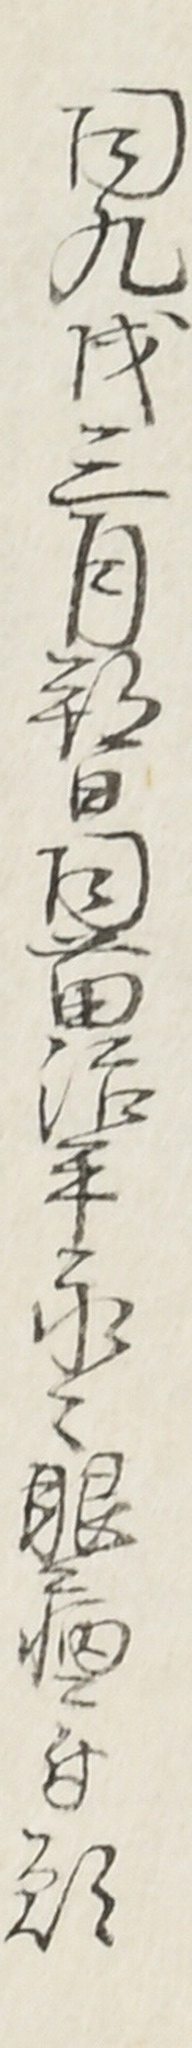一同九戌三月朔日同苗治平永々眼病ニ付願
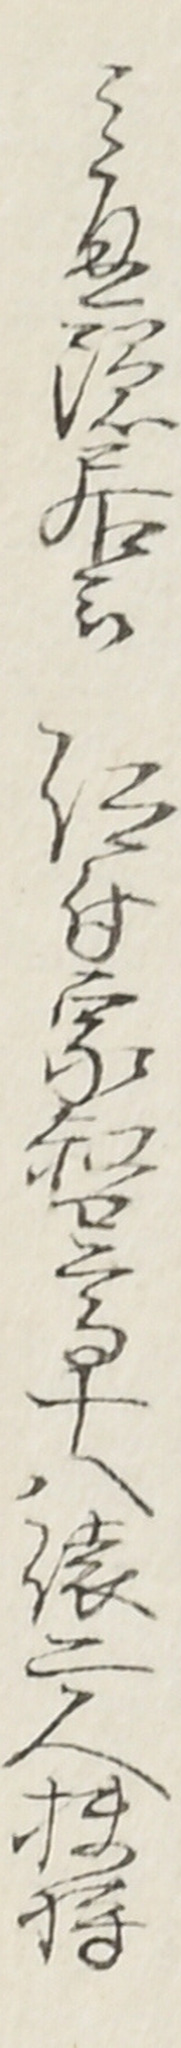之通隠居被仰付家督高十八俵二人扶持
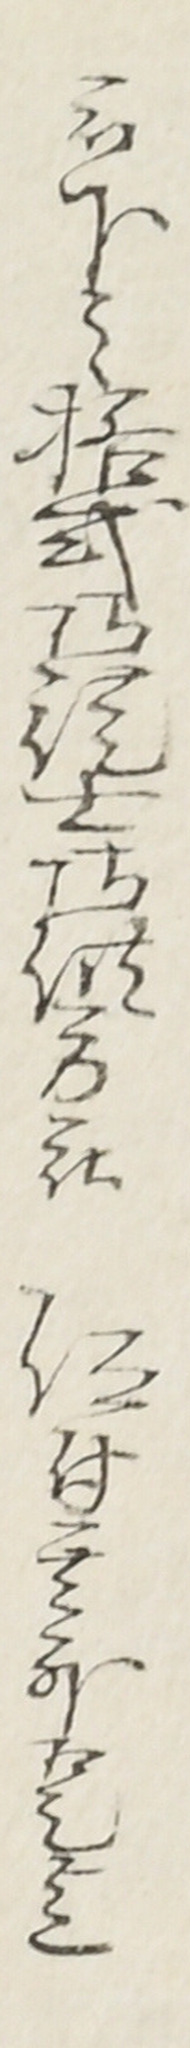被下之格式御徒士御供方被仰付其外是迄
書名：給人諸士勤仕録（七）
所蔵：伊那市立高遠町図書館・合同会社AMANE
